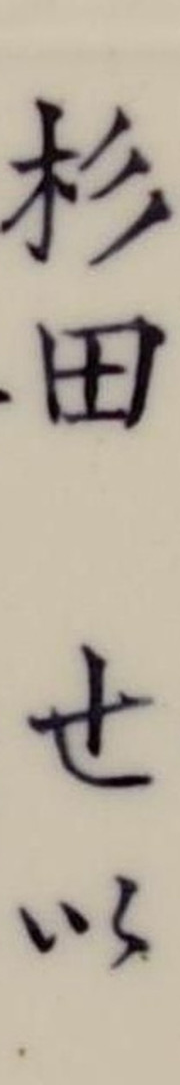杉田せい
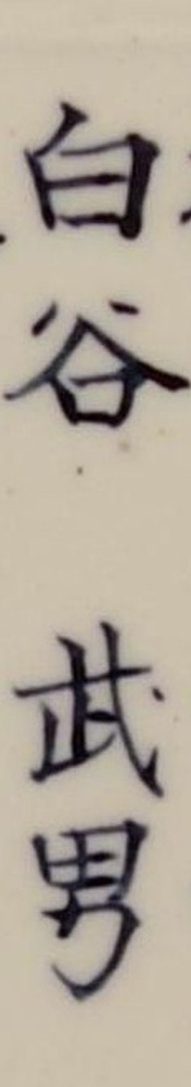白谷武男
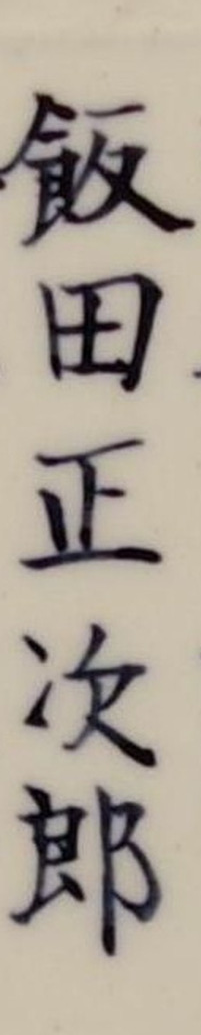飯田正次郎
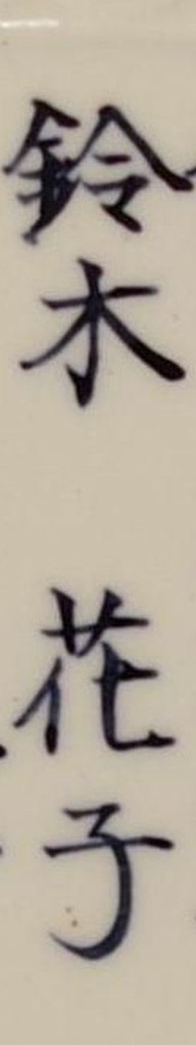鈴木花子
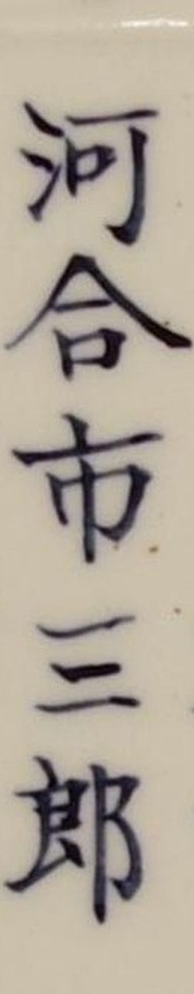河合市三郎
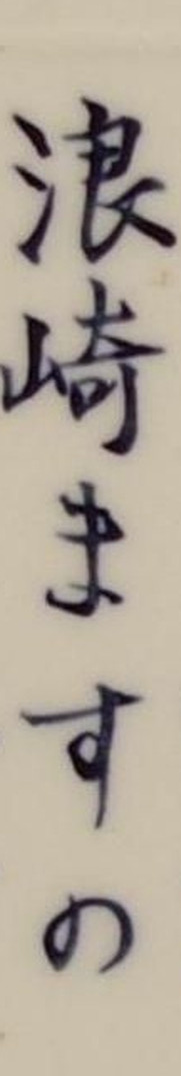沼崎ますの
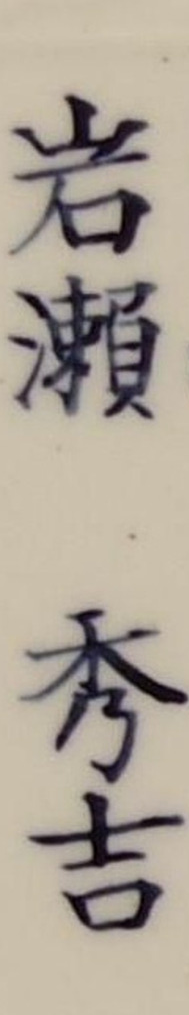岩瀬秀吉

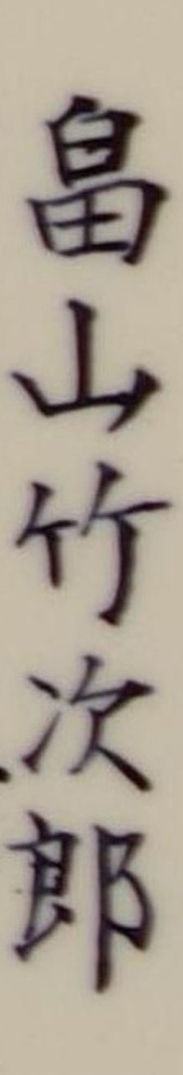畠山竹次郎
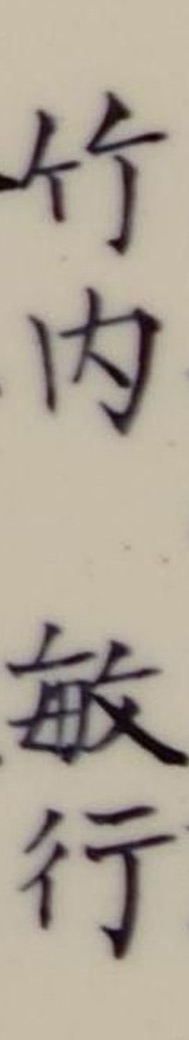竹内敏行
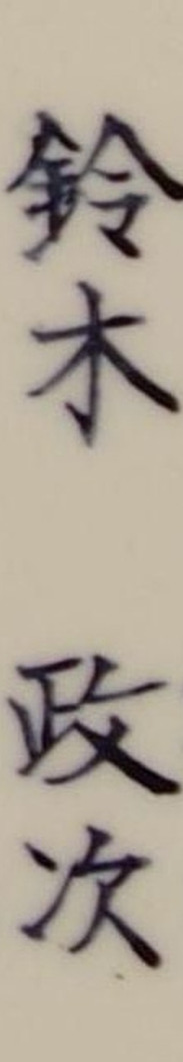鈴木政次
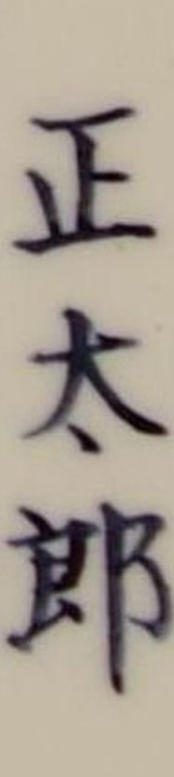正太郎
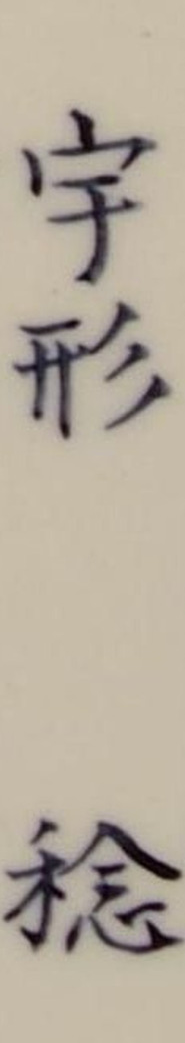宇形稔
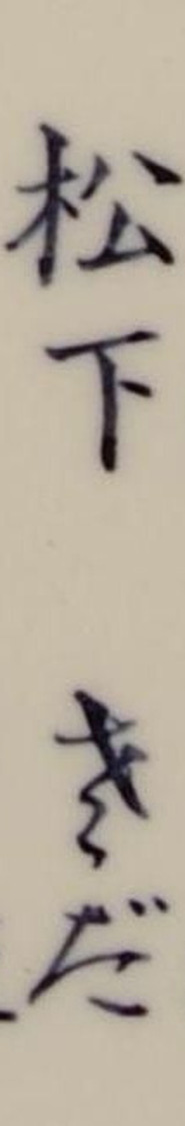松下さだ
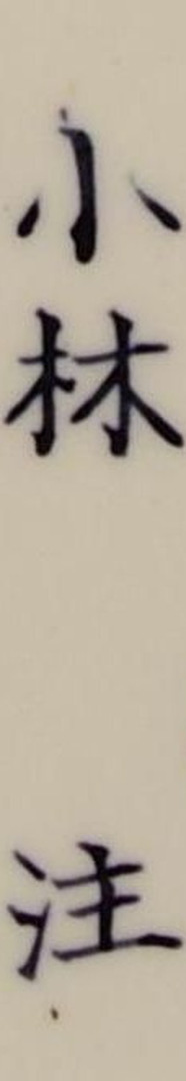小林注
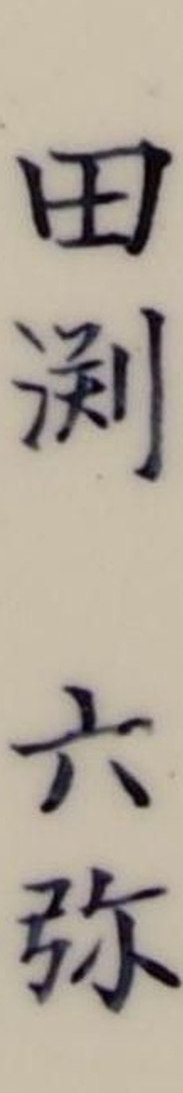田渕六弥
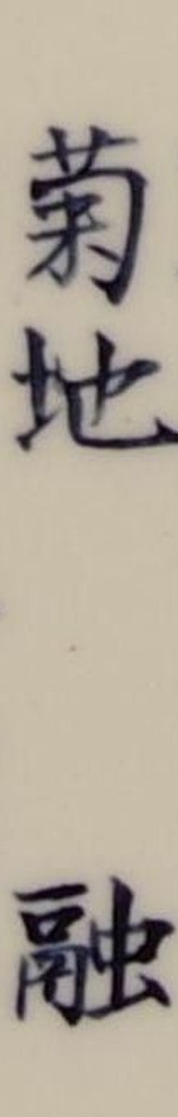菊地融
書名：M~S
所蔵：高野山金剛峯寺
